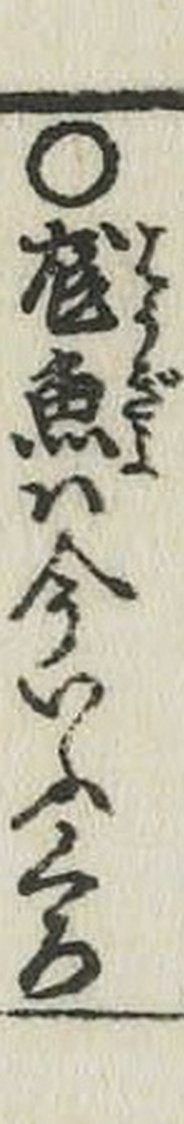○尨魚は今いふくろ
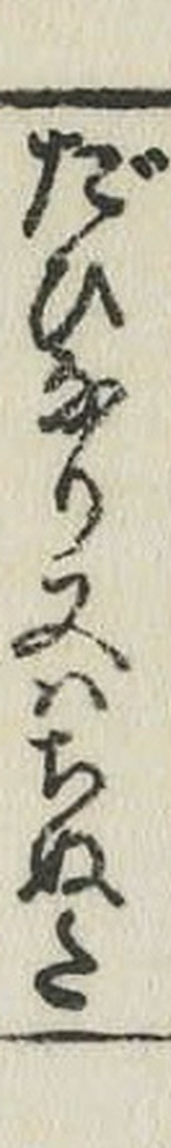だひなり又はちぬた
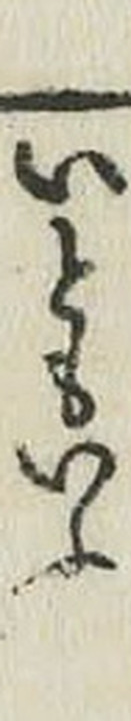いともいふ
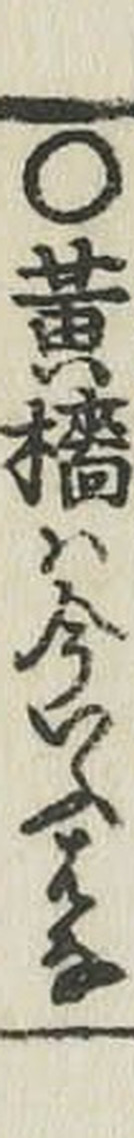○黄檣は今いふはな
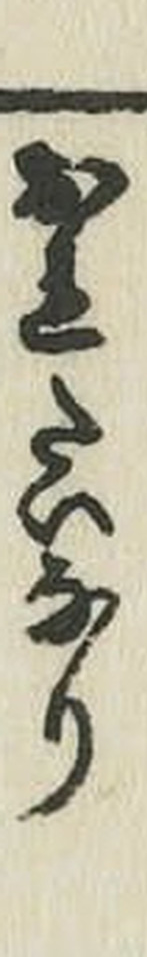おれたいなり
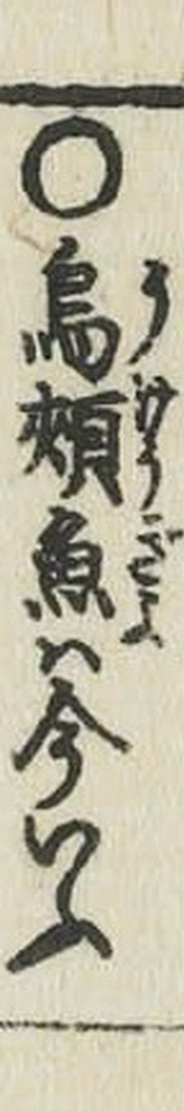○烏頬魚は今いふ
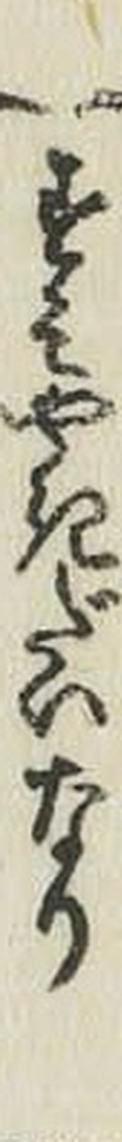すみやきだいなり
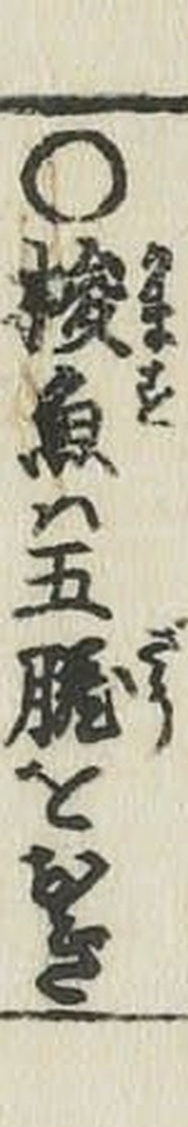○梭魚は五臓をおぎ
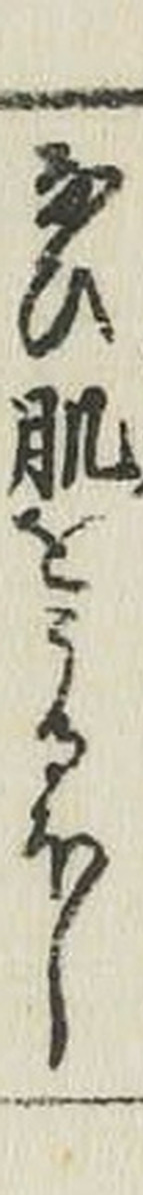なひ肌をうるほし
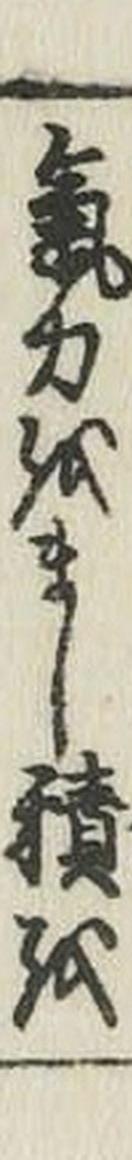気力をまし積を
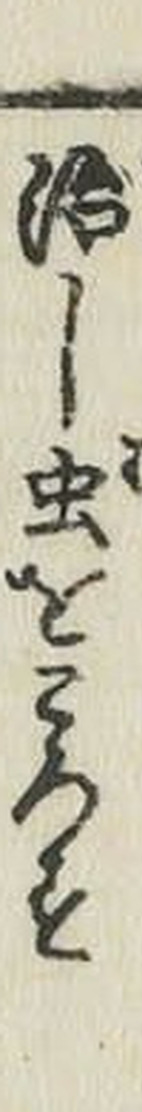治し虫をころす
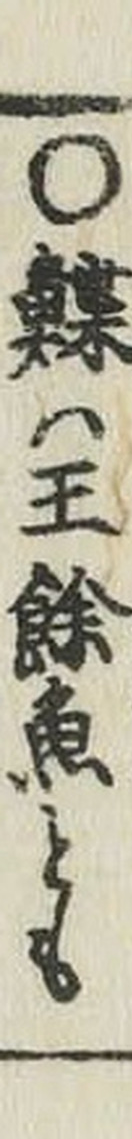○鰈は王餘魚とも
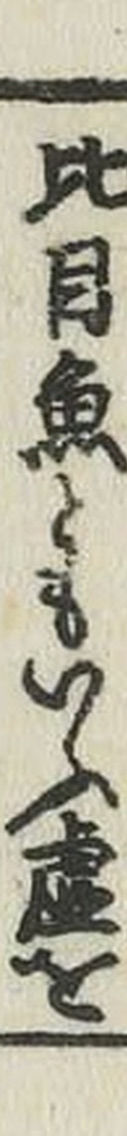比目魚ともいふ虚を
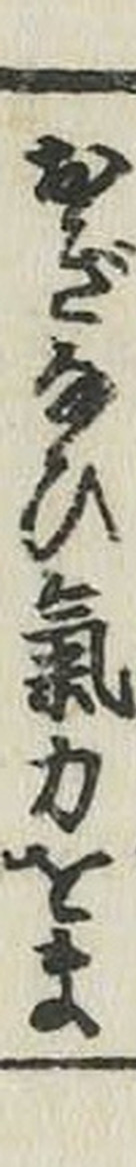おぎなひ気力をま
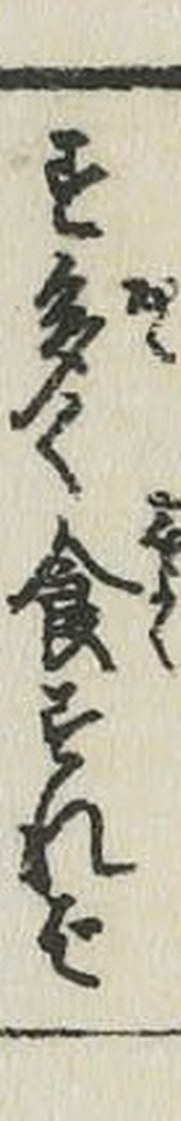す多く食すれば
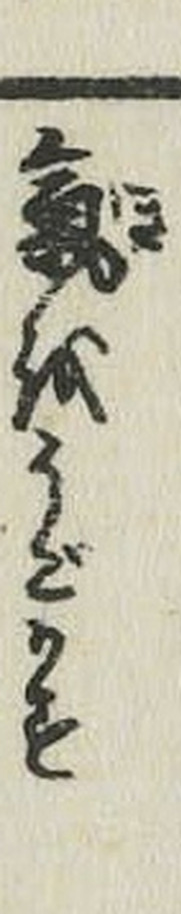気をうごかす
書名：増補頭書訓蒙図彙大成 10巻 7:巻之14-16
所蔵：東京学芸大学教育コンテンツアーカイブ
